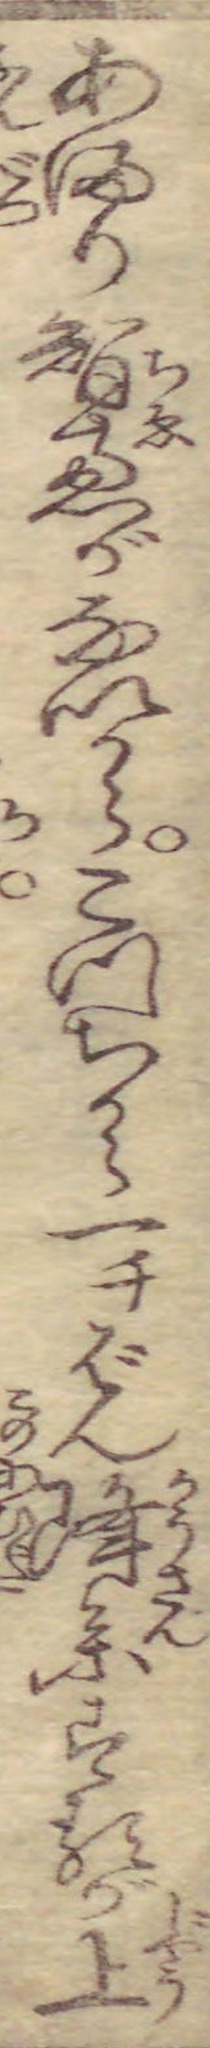あまり智恵がないから。こつちから一チばん降参するが上
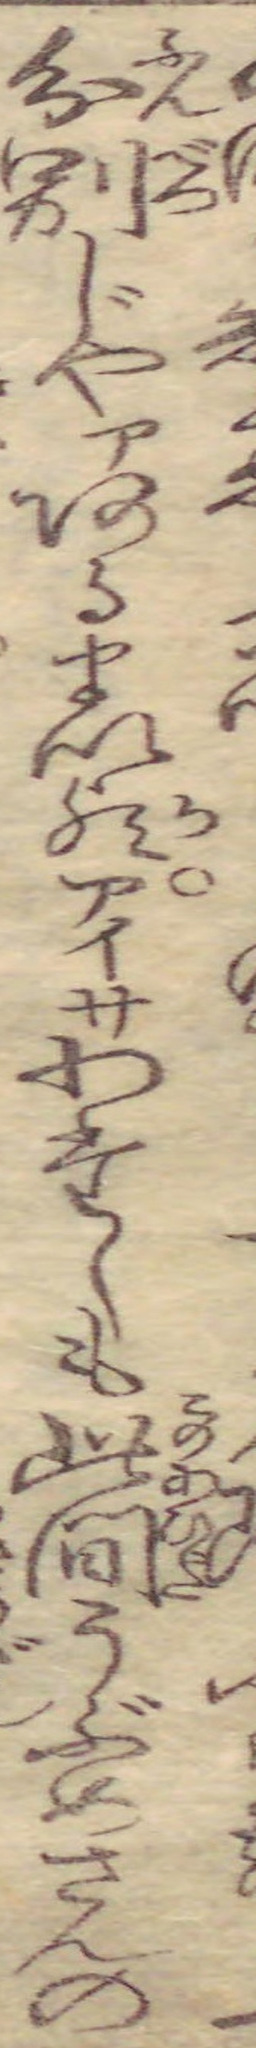分別じやァあるまい歟。アイサわたしも此間うぶめさんの
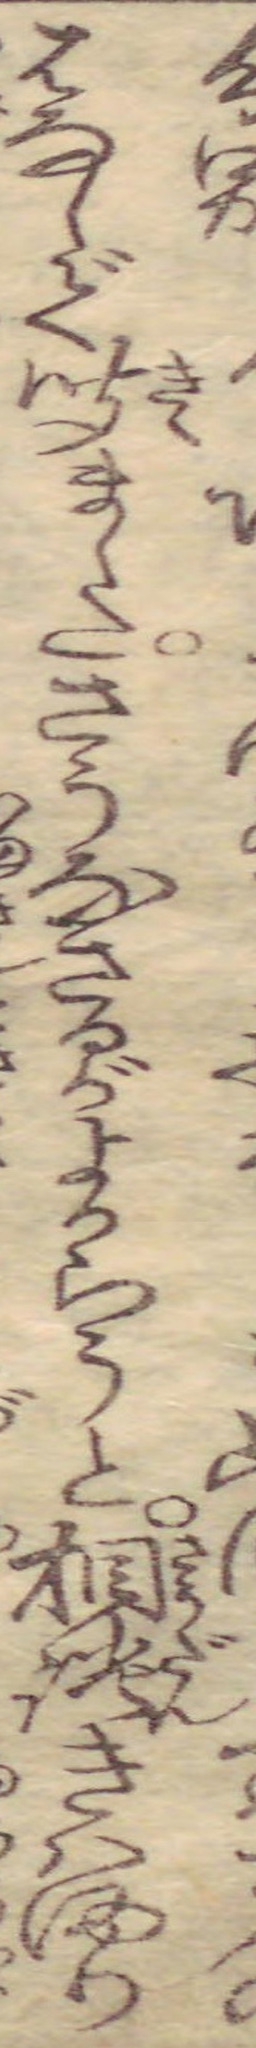はなしで聞ました。さうなさるがよからうと。相談きはまり
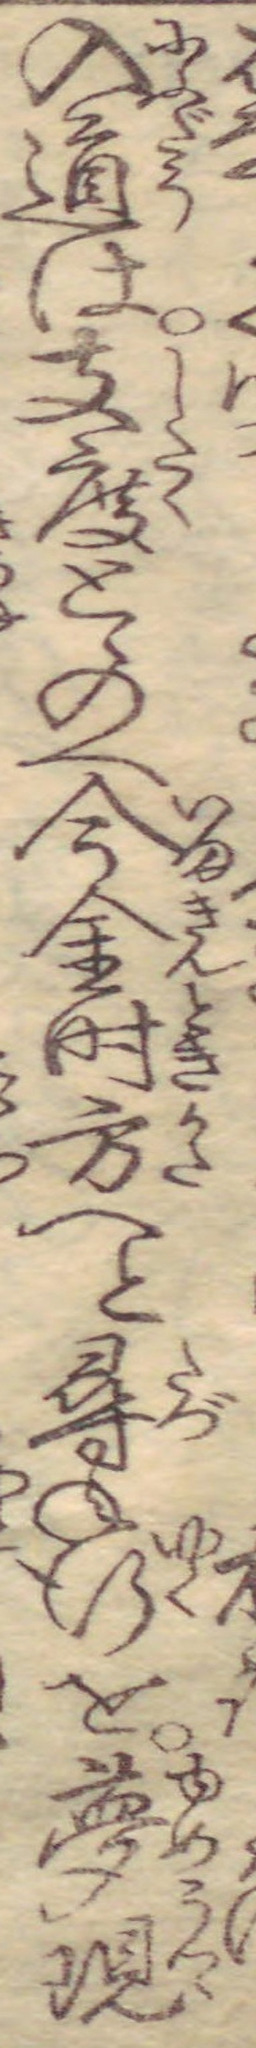入道は。支度とゝのへ今金時方へと尋ね行を。夢現
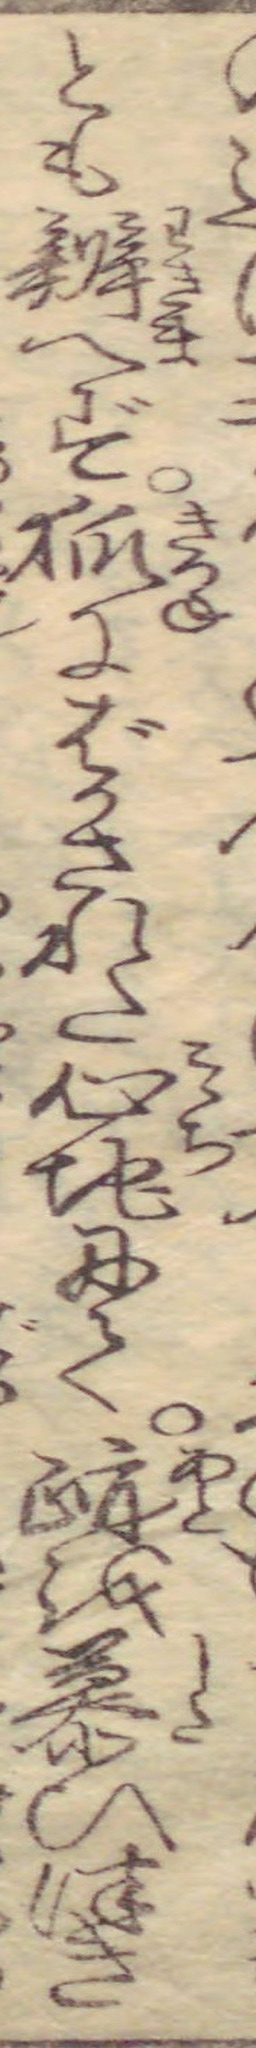とも辨へず。狐にばかされた心地にて。跡を慕ひつき
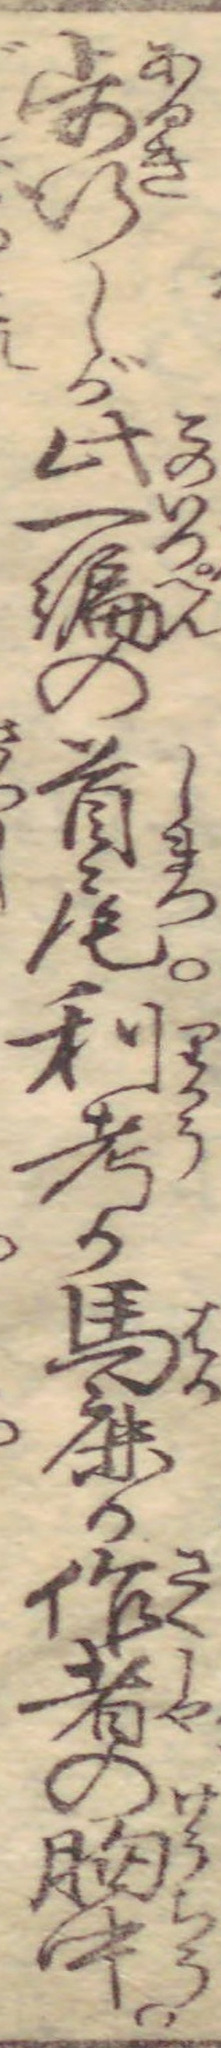歩行しが此一編の首尾。利考か馬鹿か作者の胸中。
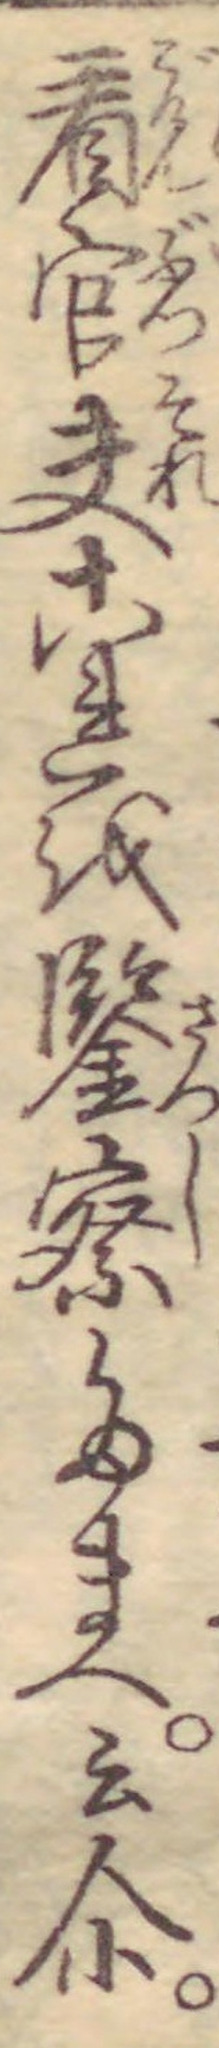看官夫これを鍳察たまへ。云尒。
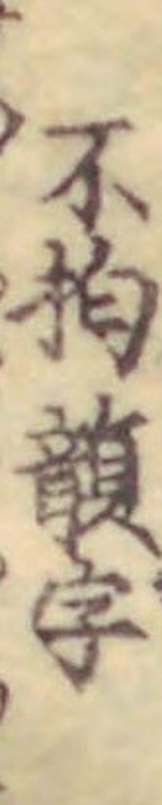不均韻字
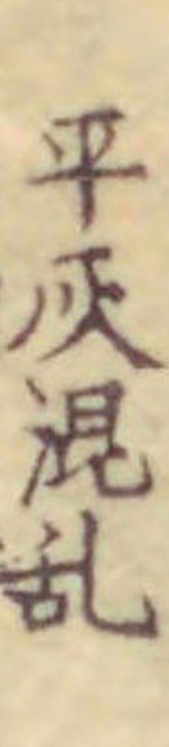平灰混乱
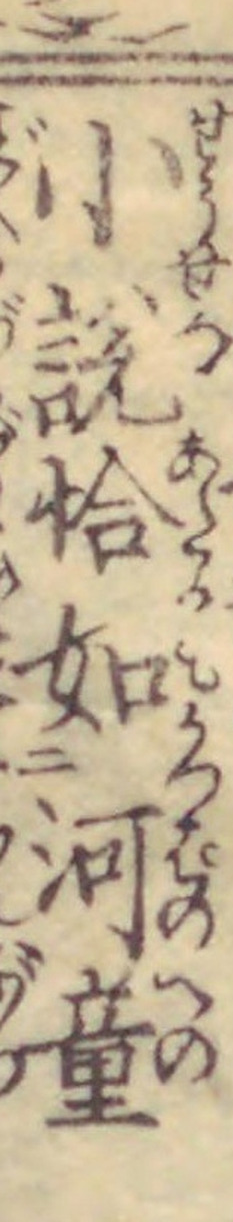小説恰如河童
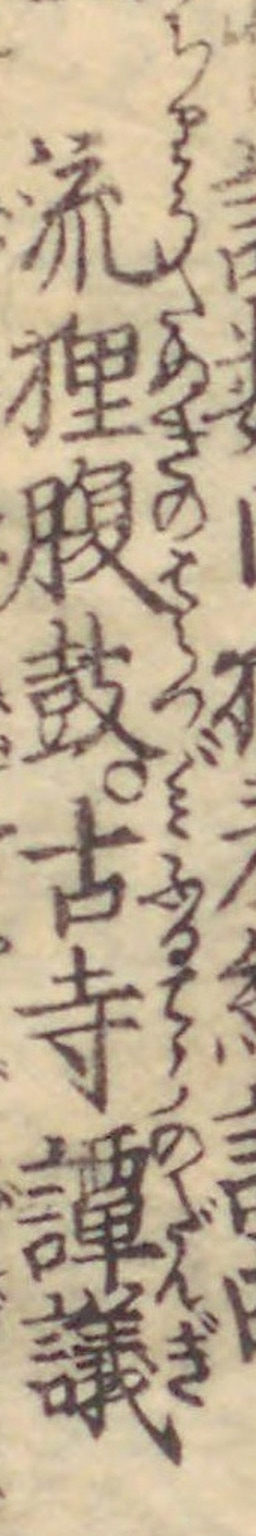一流狸腹鼓。古寺譚議
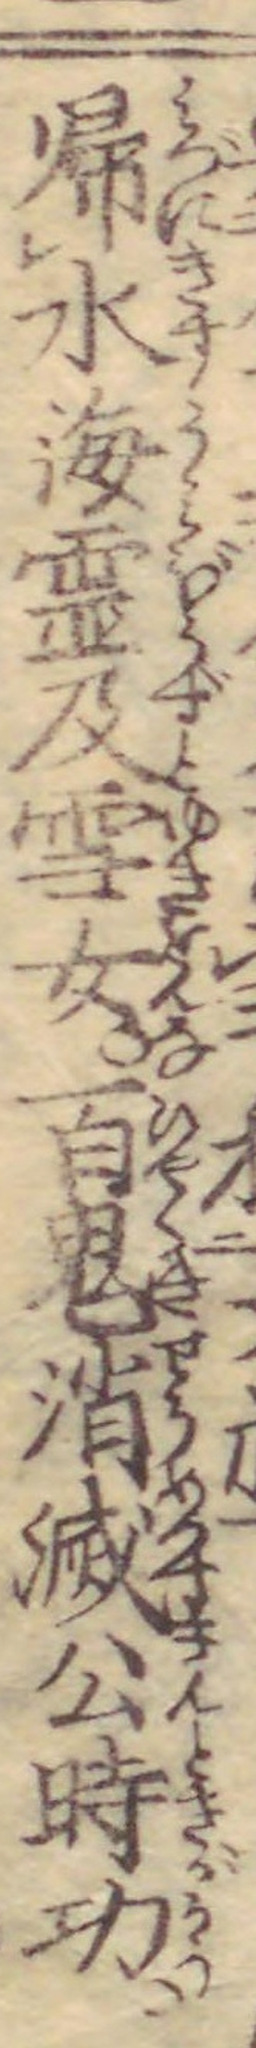帰水海霊及雪女。百鬼消滅公時功。
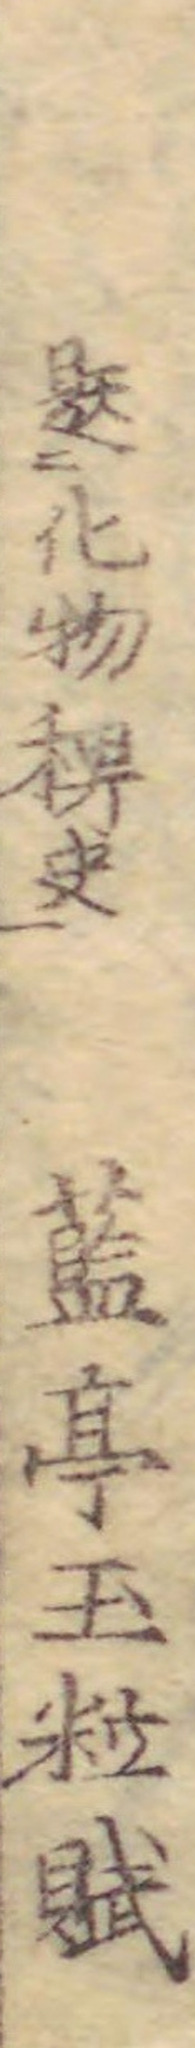題化物稗史藍亭玉粒賦

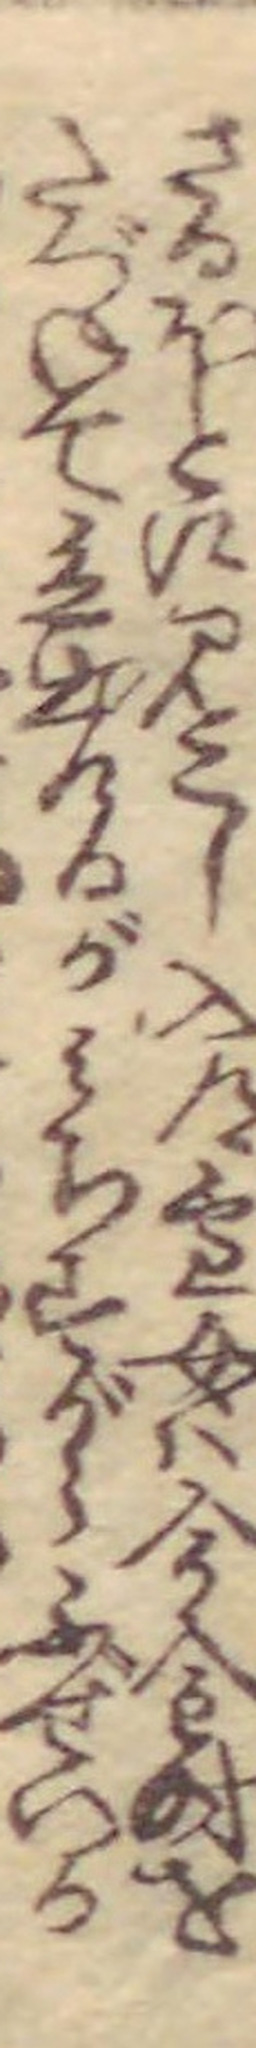たづねて立出けるがみちすがらふぜいか
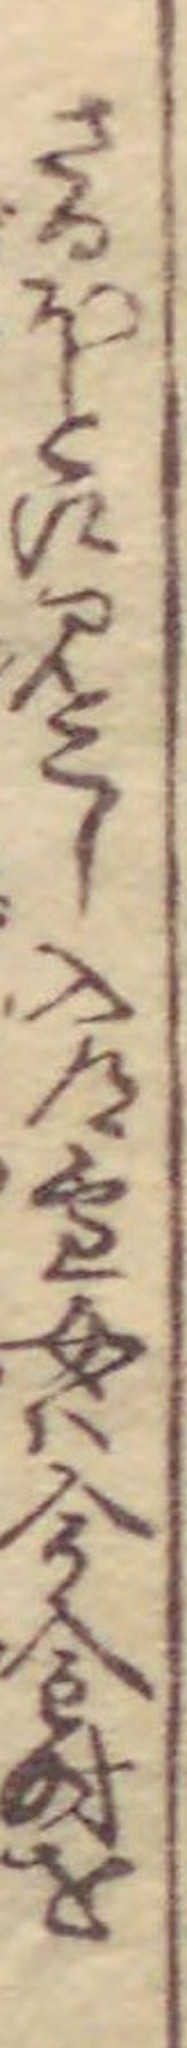さるほとに見こし入道雪女は今金時を
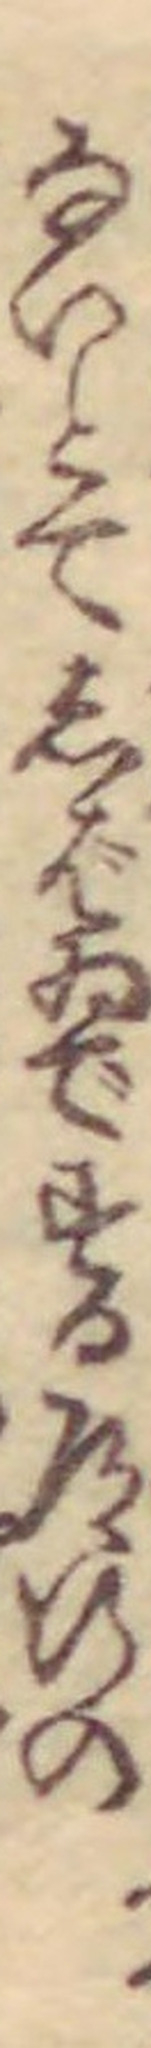ないとてしばゐでする道行の
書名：化物世帯氣質
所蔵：国立国会図書館 National Diet Library, JAPAN
